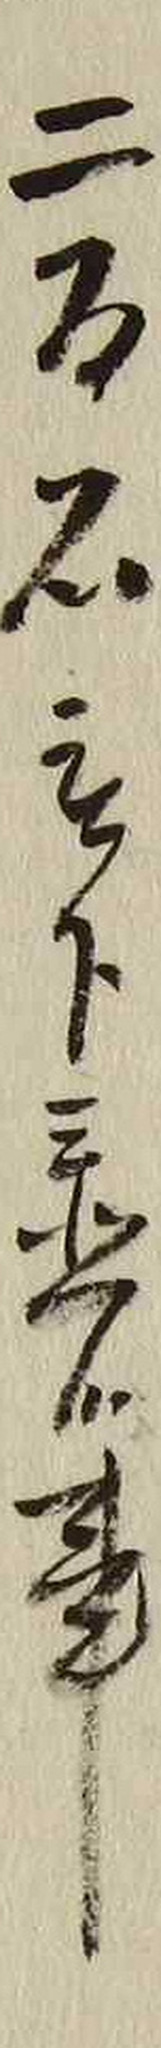二百石被下置候事
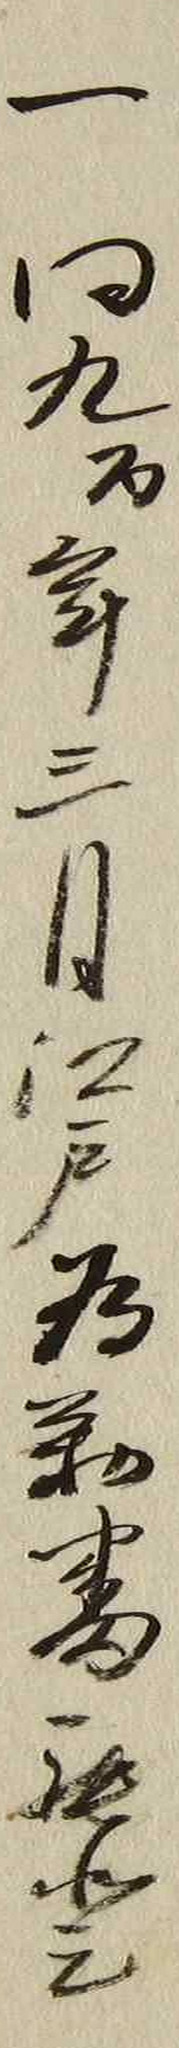一同九酉年三月江戸為勤番罷登
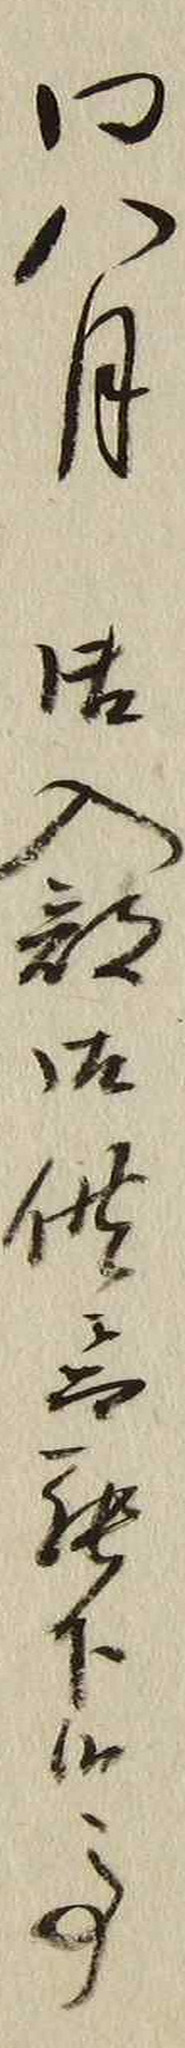同八月御入部御供ニ而罷下候事
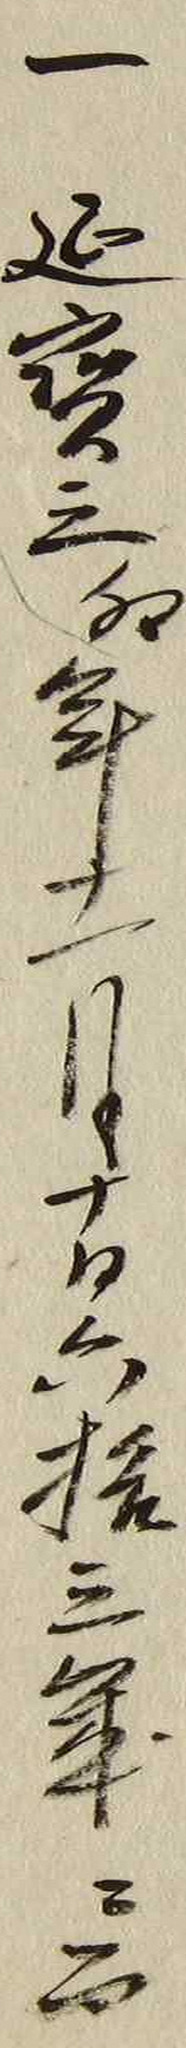一延宝三卯年十一月十日六拾三歳ニ而
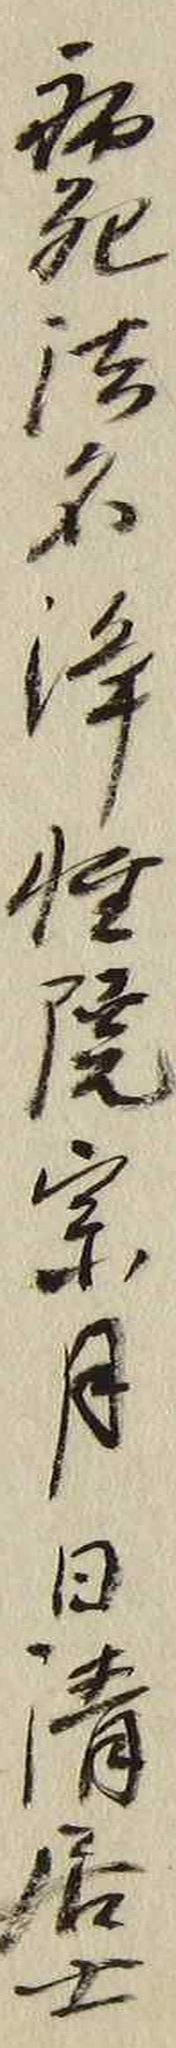病死法名浄性院宗月日清居士
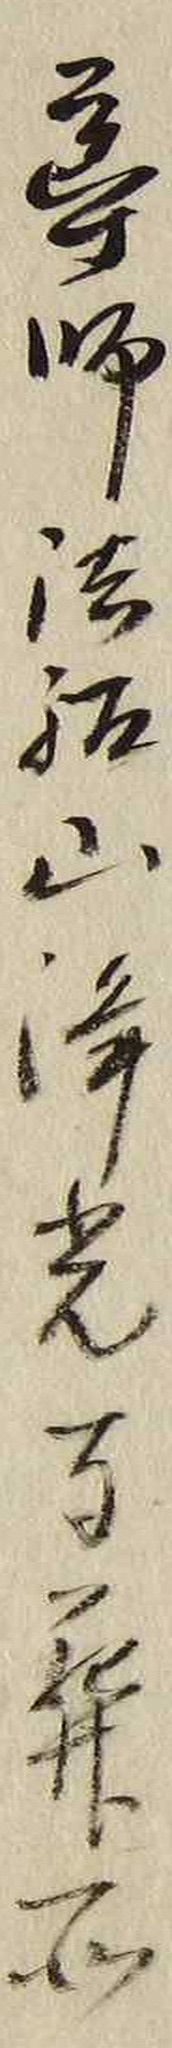導師法紹山浄光寺葬所

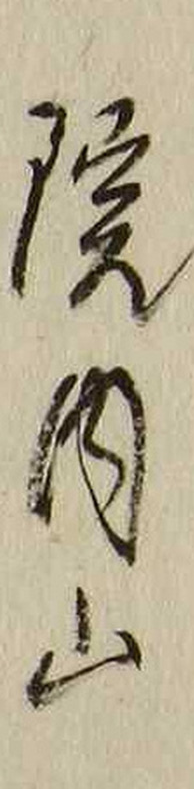院内山
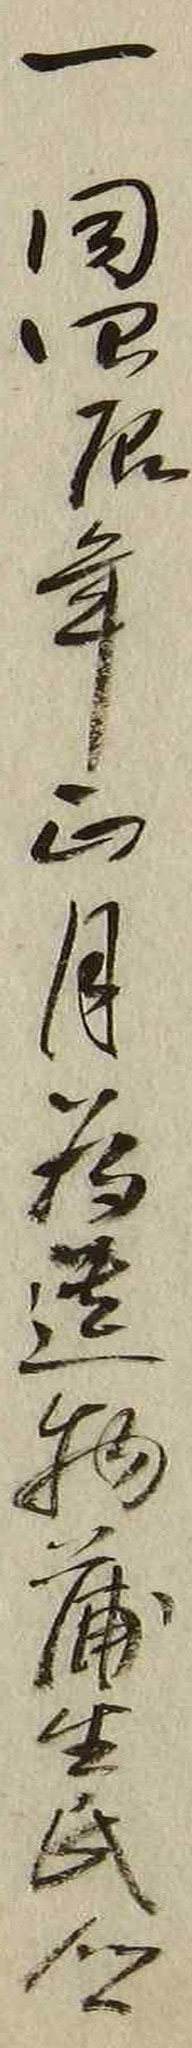一同四辰年正月為遺物蒲生氏郷
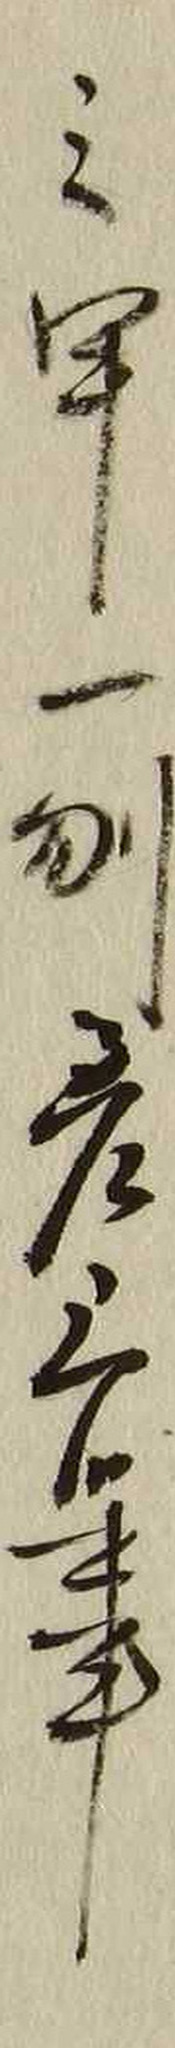之甲一刎差上候事
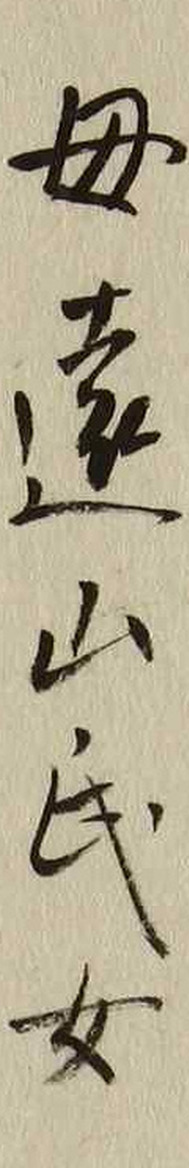母遠山氏女
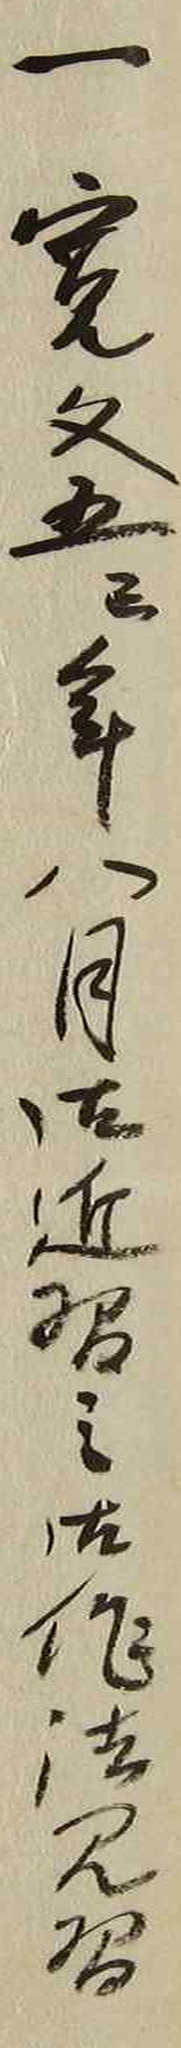一寛文五巳年八月御近習之御作法見習
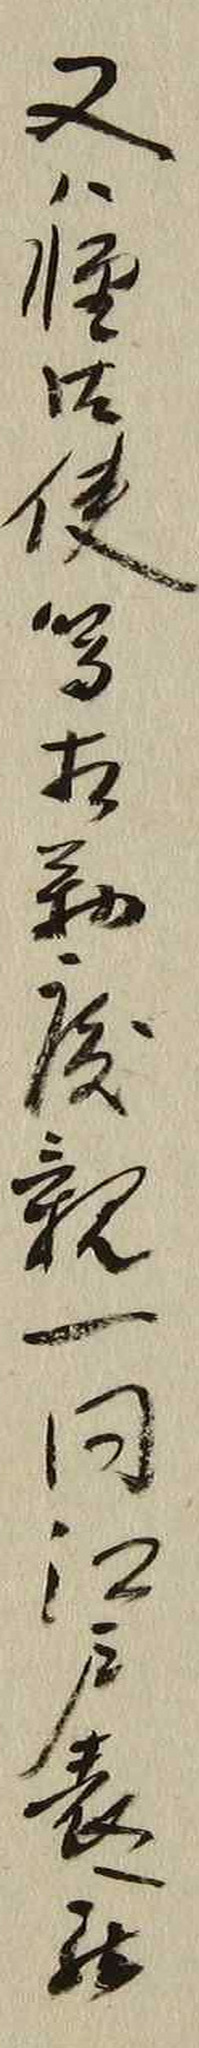又ハ軽御使等相勤度親一同江戸表へ罷
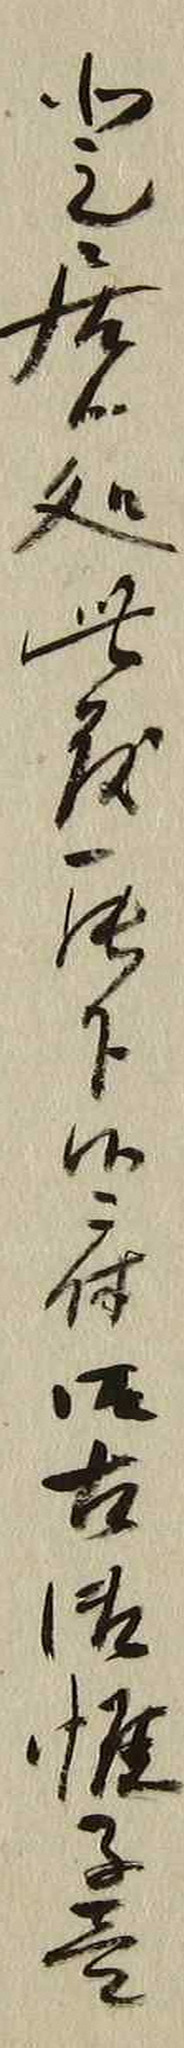登居候処此度罷下候ニ付御古御帷子壱
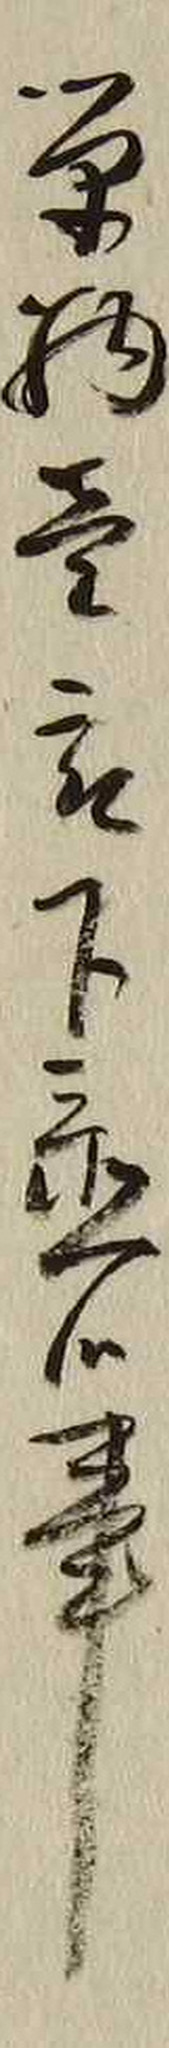単物壱被下置候事
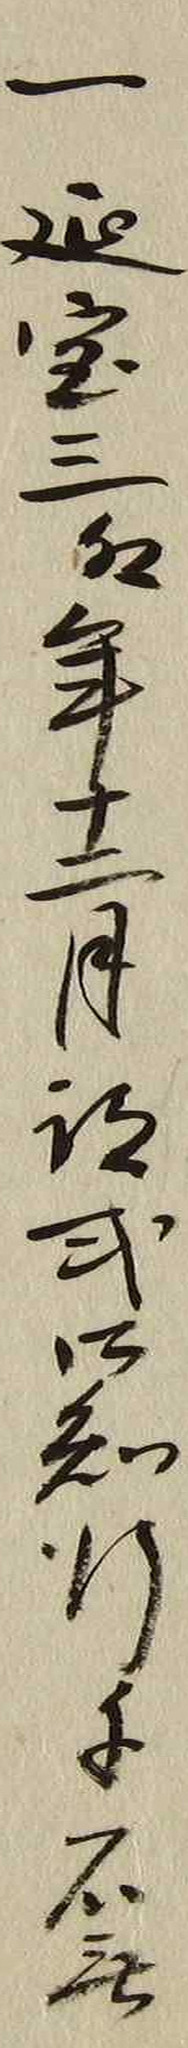一延宝三卯年十二月跡式御知行千石無
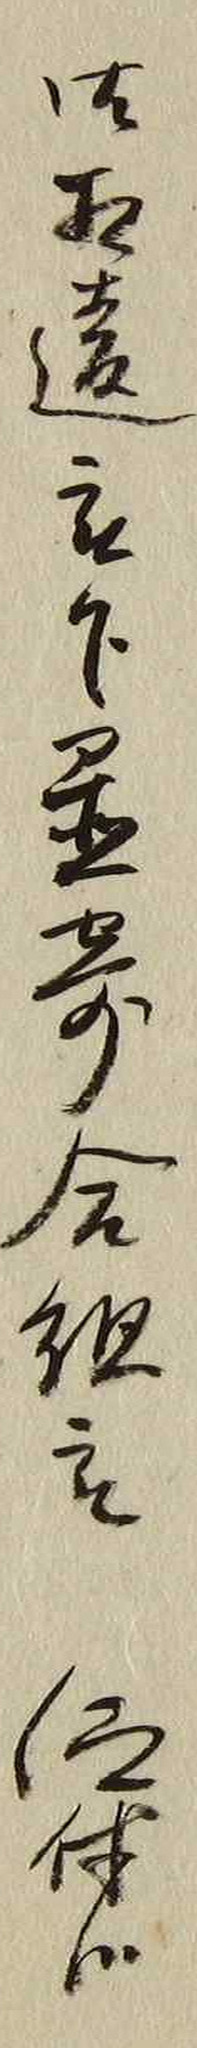御相違被下置寄合組被仰付候
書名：諸士系譜　巻之351　す之部1
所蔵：会津若松市立会津図書館
